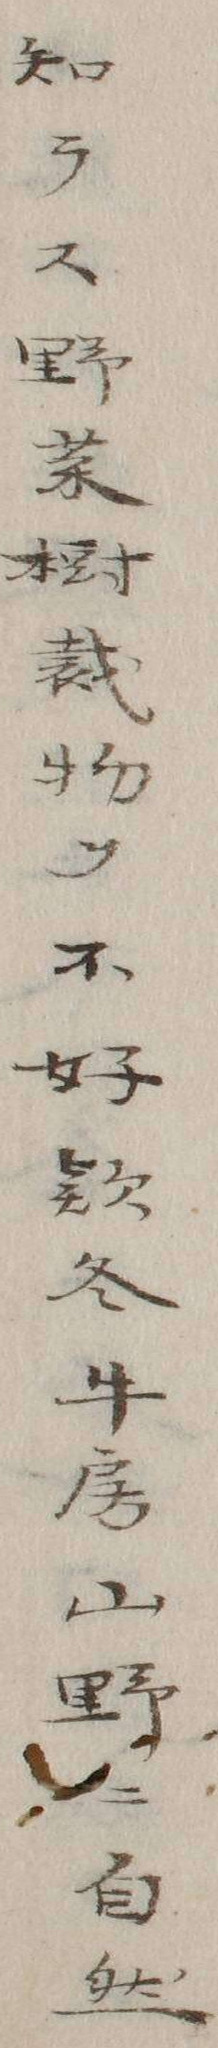知ラス野菜樹裁物ヲ不好欵冬牛房山野ニ自然

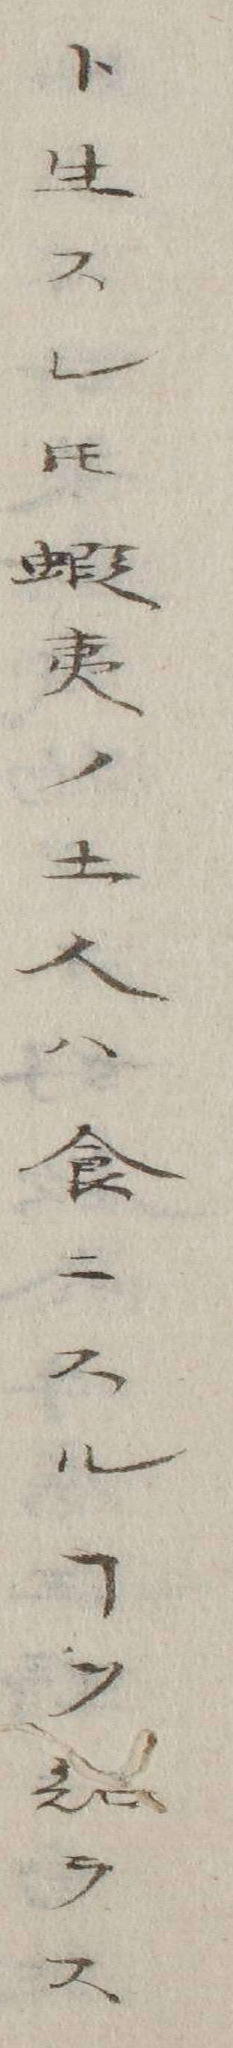ト生スレ𪜈蝦夷ノ土人ハ食ニスルヿヲ知ラス
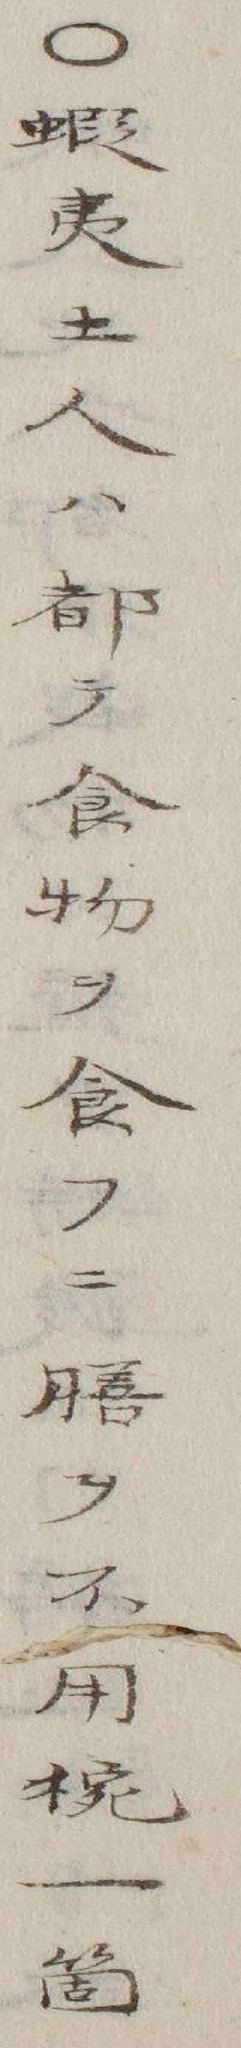〇蝦夷土人ハ都テ食物ヲ食フニ膳ヲ不用椀一箇
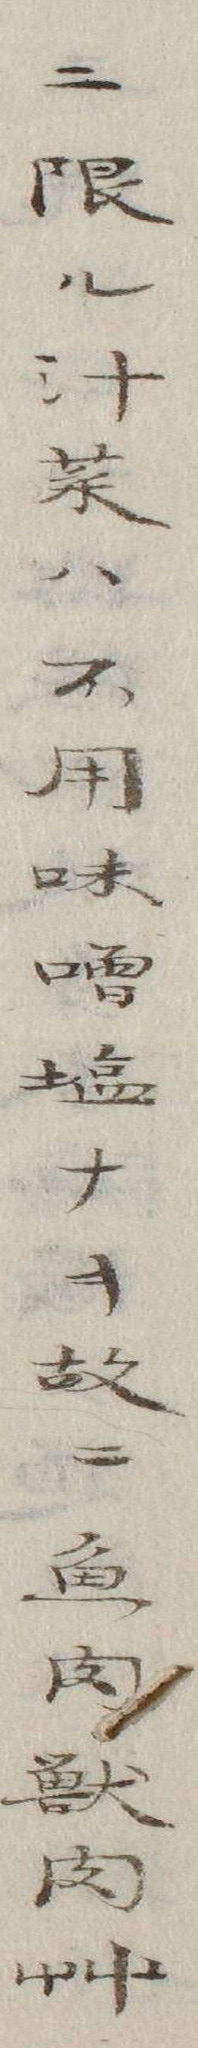ニ限ル汁菜ハ不用味噌塩ナキ故ニ魚肉獣肉草
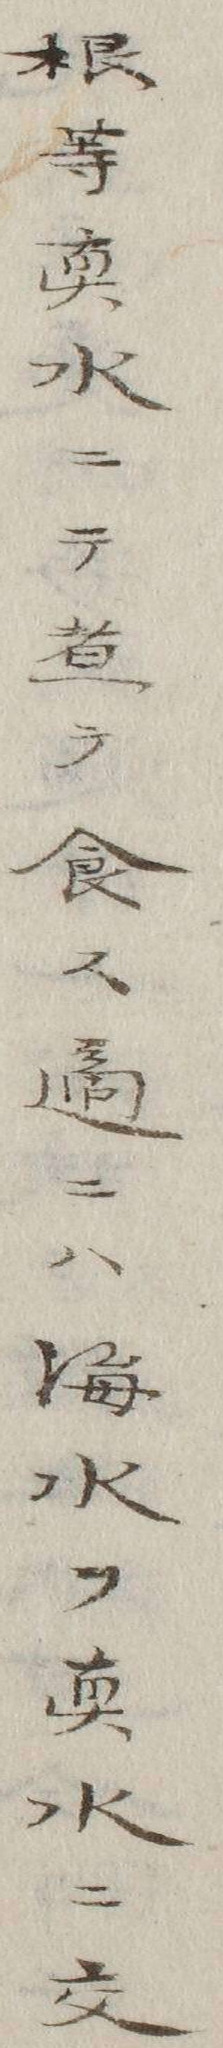根等真水ニテ煮テ食ス適ニハ海水ヲ真水ニ交
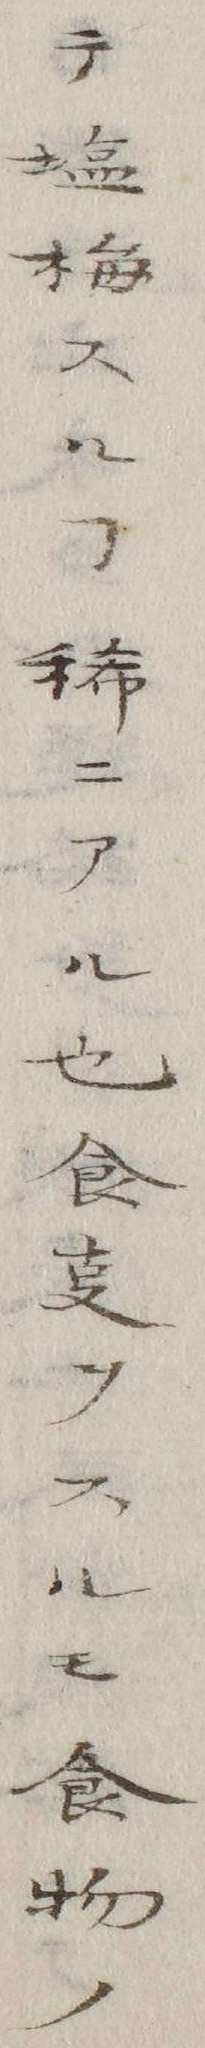テ塩梅スルヿ稀ニアル也食事ヲスルモ食物ノ
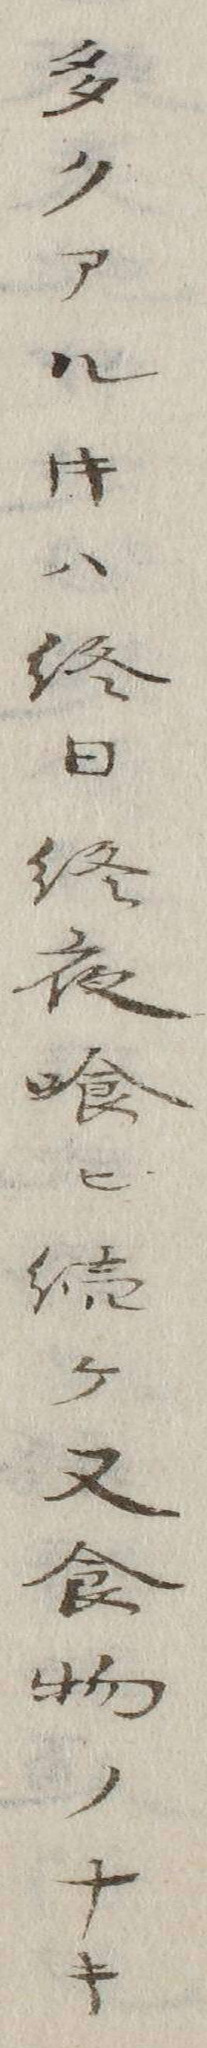多クアルトキハ終日終夜喰ヒ続ケ又食物ノナキ
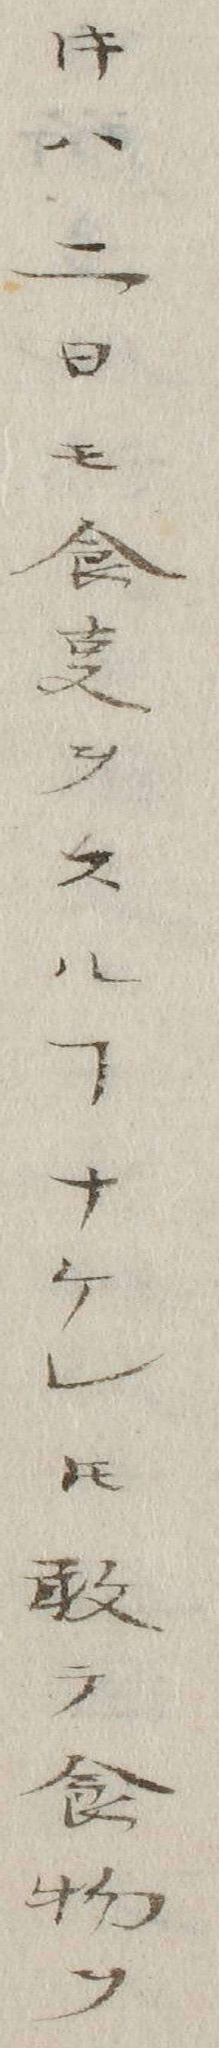トキハ二日モ食事ヲスルヿナケレ𪜈敢テ食物ヲ
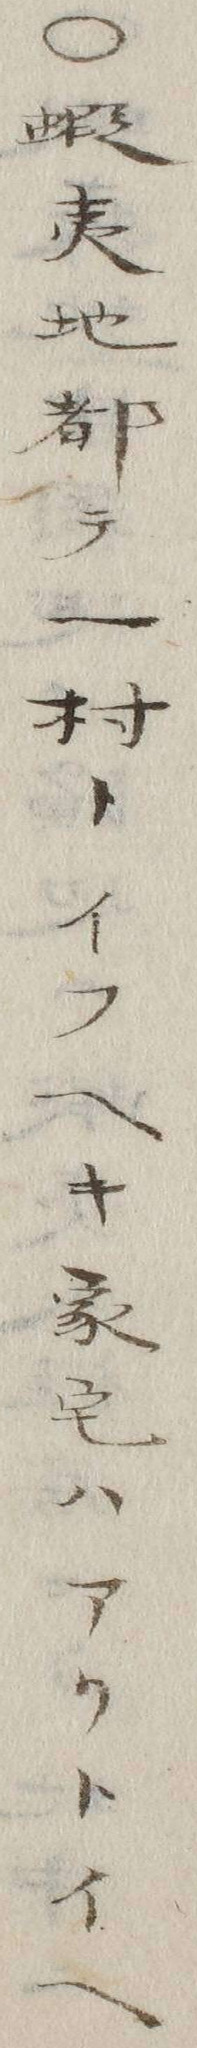〇蝦夷地都テ一村トイフヘキ家宅ハアリトイヘ
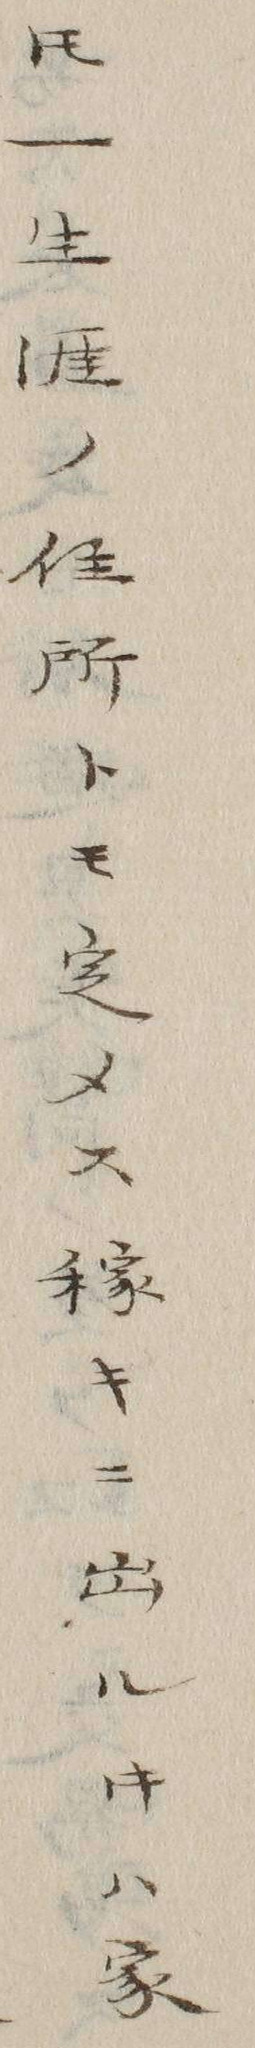𪜈一生涯ノ住所トモ定メス稼キニ出ルトキハ家
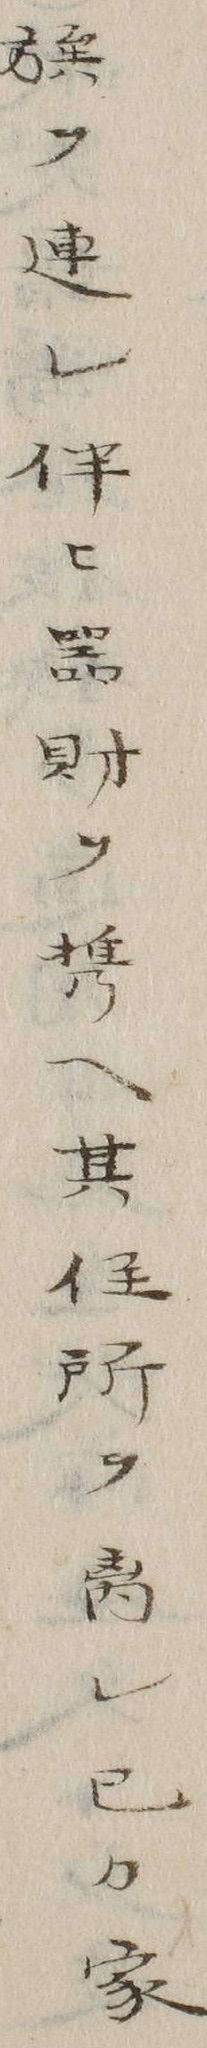族ヲ連レ伴ヒ器財ヲ携ヘ其住所ヲ離レ己カ家
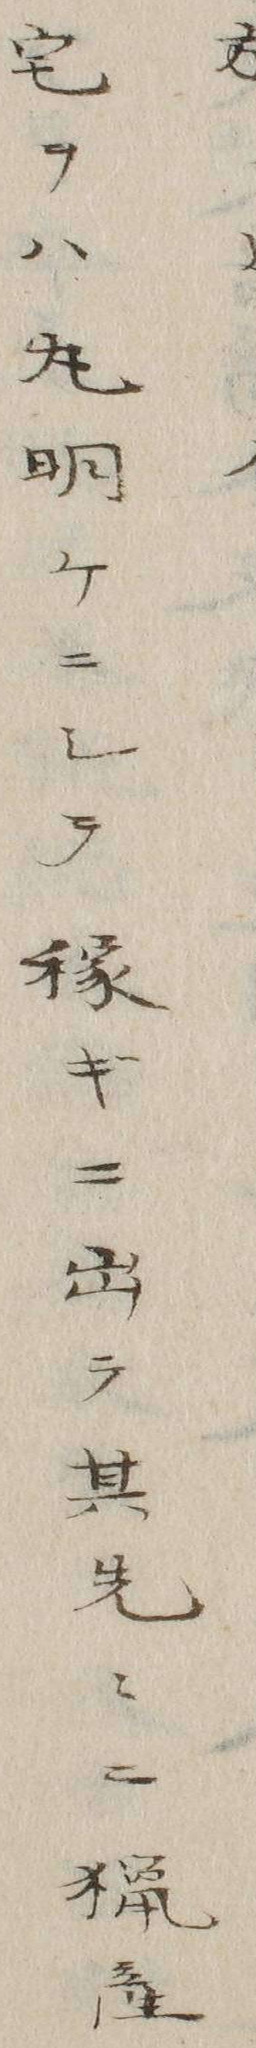宅ヲハ丸明ケニシテ稼ギニ出テ其先々ニ猟産
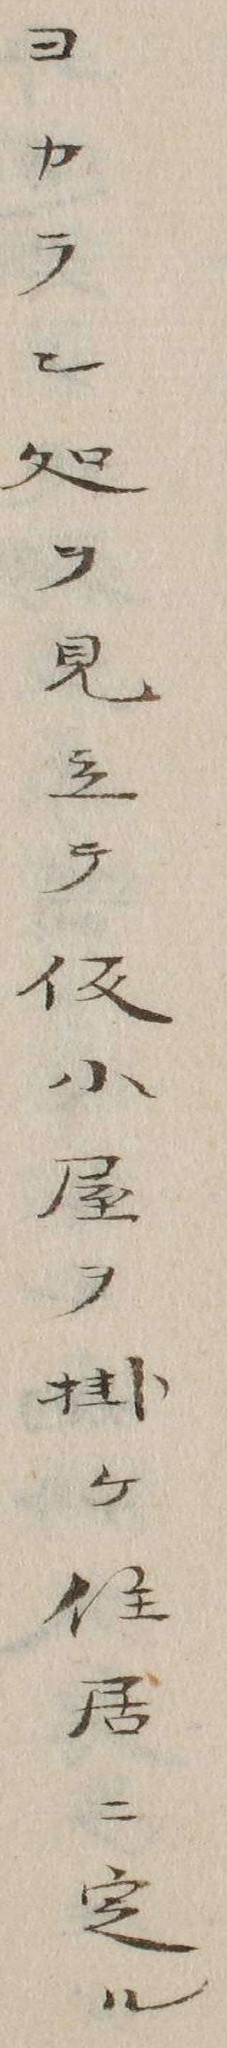ヨカラン処ヲ見立テ仮小屋ヲ掛ケ住居ニ定ル
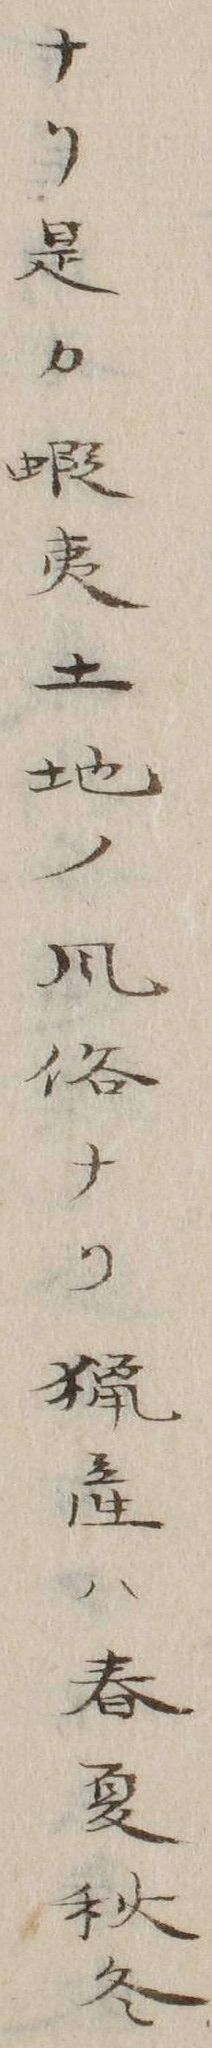ナリ是カ蝦夷土地ノ風俗ナリ猟産ハ春夏秋冬
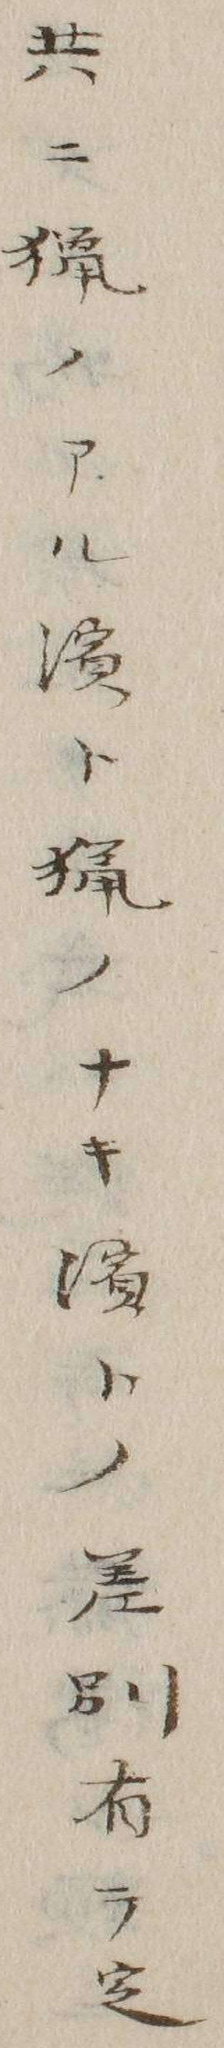共ニ猟ノアル浜ト猟ノナキ浜トノ差別有テ定
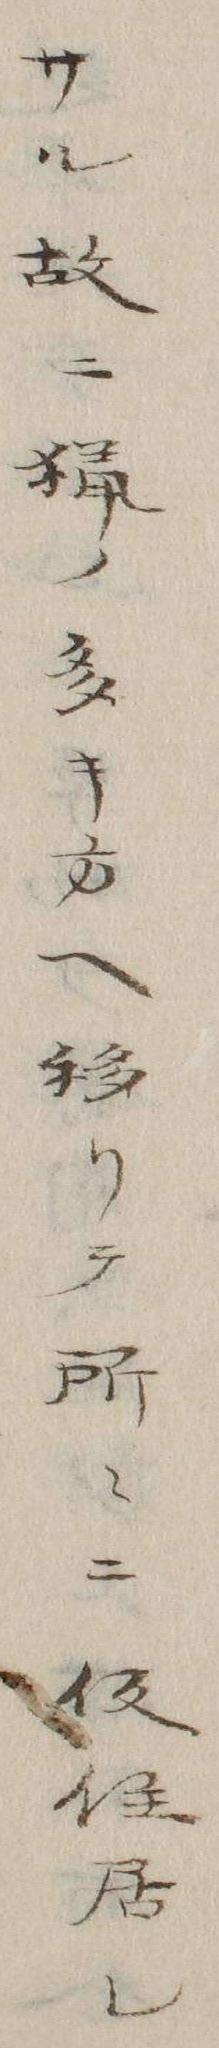サル故ニ猟ノ多キ方ヘ移リテ所々ニ仮住居シ
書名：蝦夷草紙（国文学研究資料館）
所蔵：国文学研究資料館
